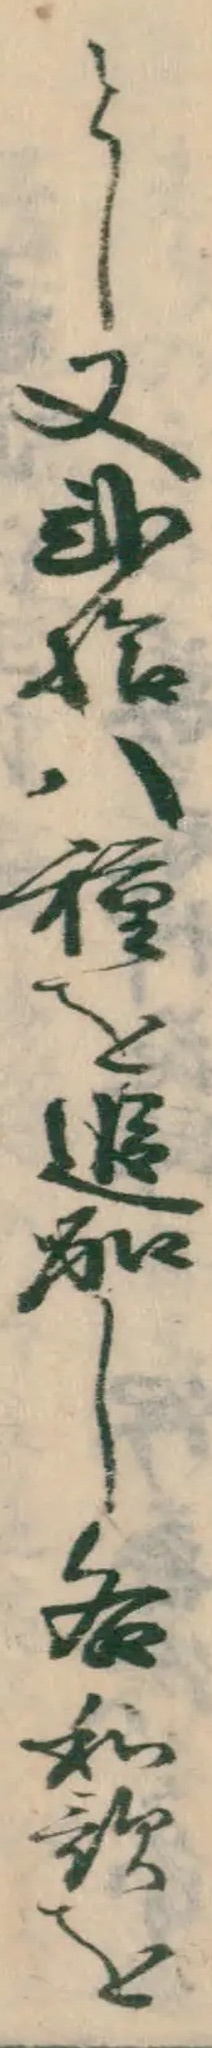とし又弐拾八種を追加し各和歌を
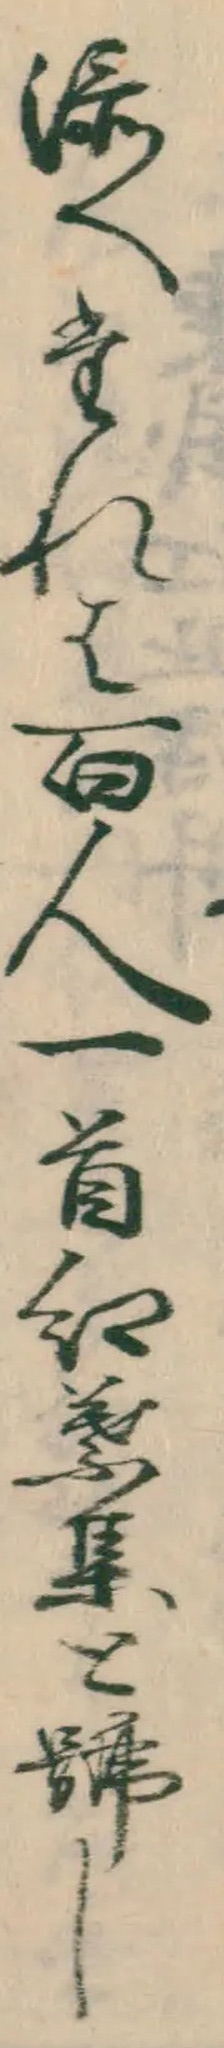添へたれは百人一首紅葉集と号し
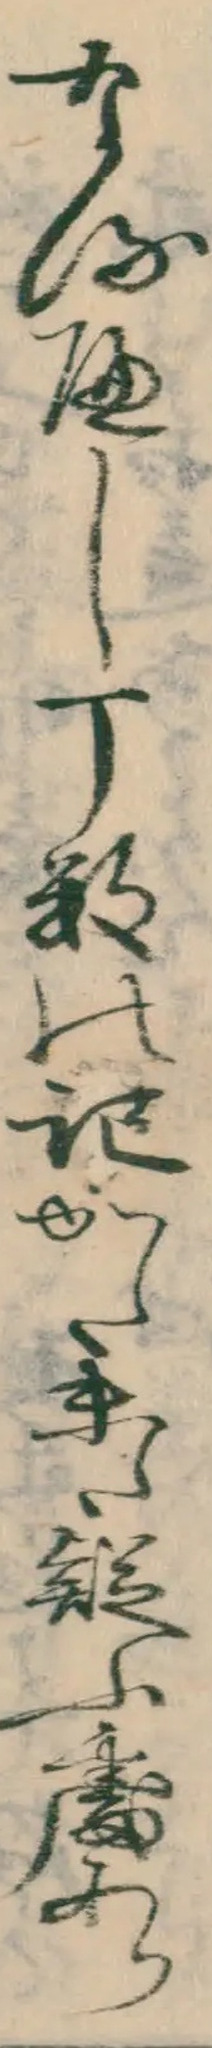なるへし丁数の記かた未だ疑ふ處あり
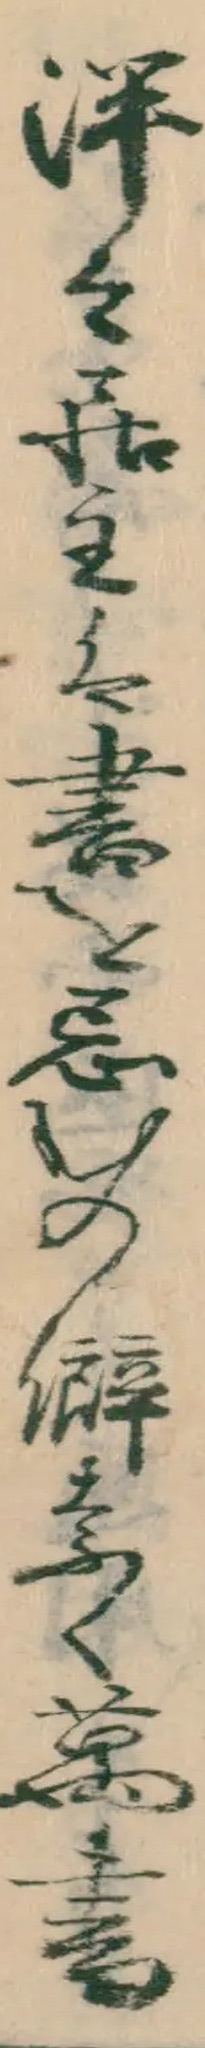伴々居主は書を忌むの僻なく萬書
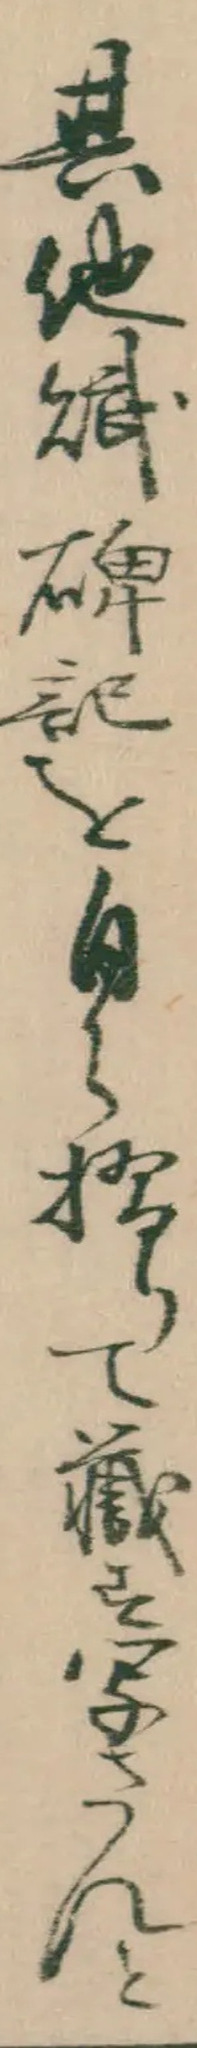其他賦碑記を自ら摺りて蔵す写さんと
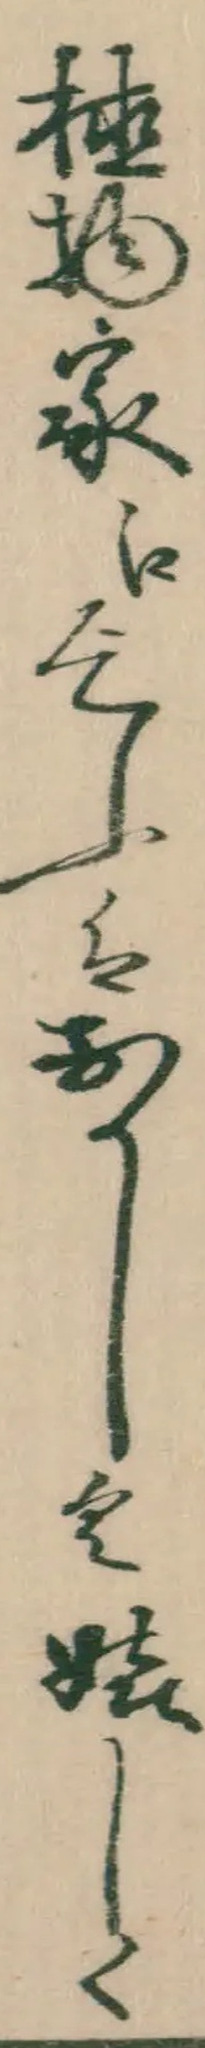植物家え乞ふはおかしく嬉しく
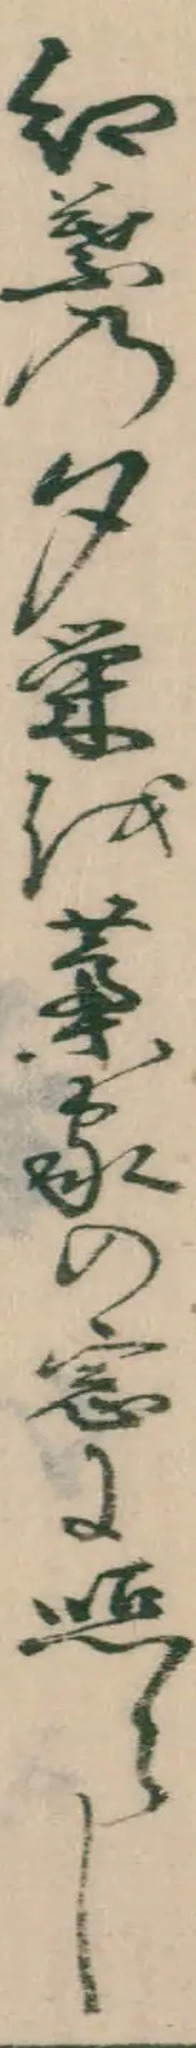紅葉の夕栄を藁家の窓に照らし
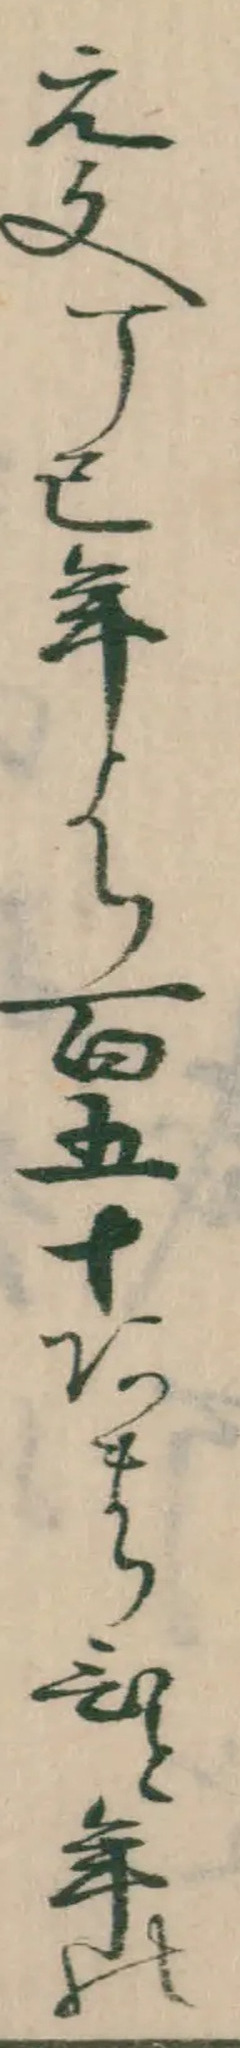元文丁巳年より百五十あまりひと年の
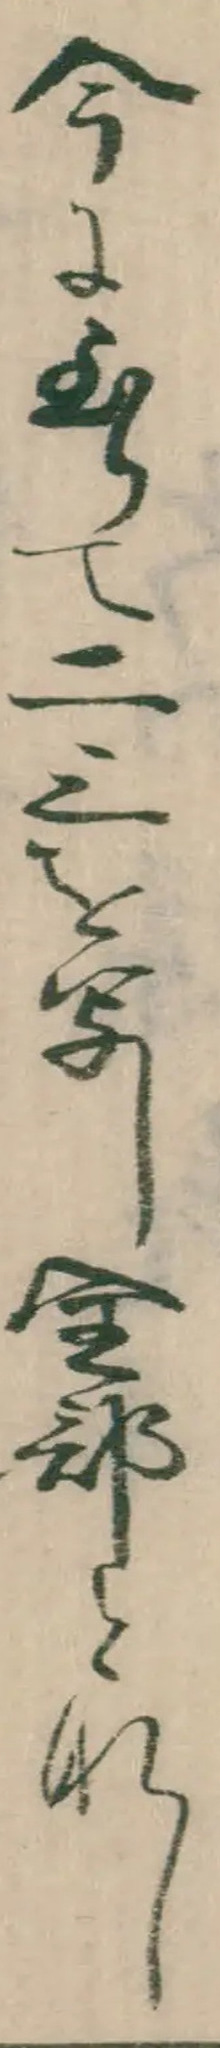今に至りて二三を写し全部となし
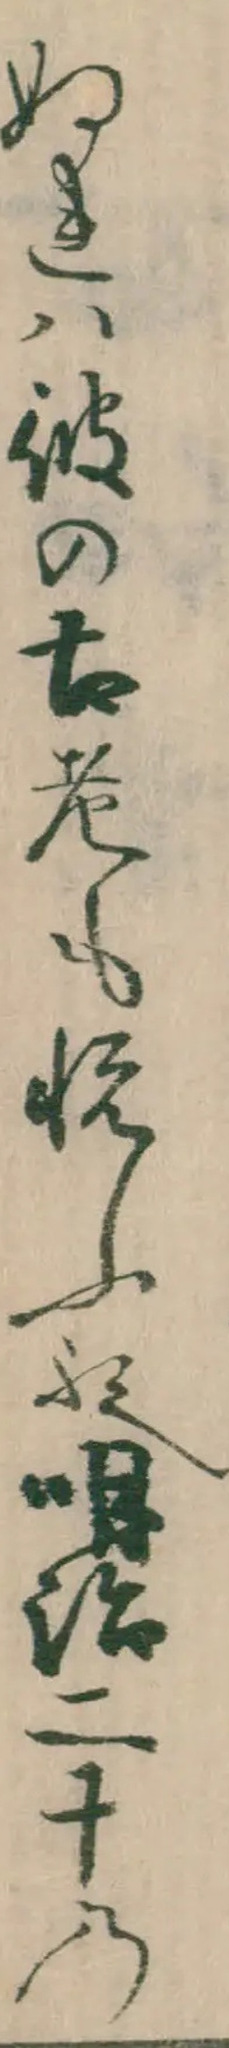ぬれは彼の古老も悦ふ歟明治二十の
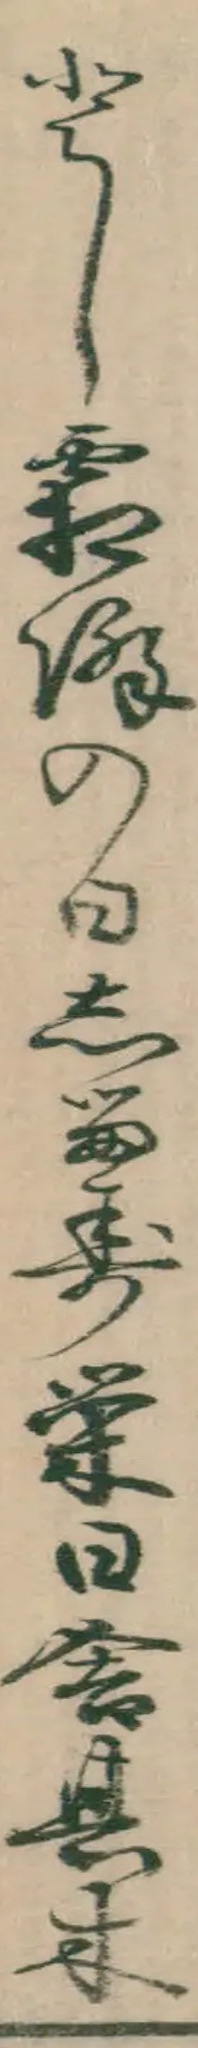とし霜降の日しるす栄日舎其木

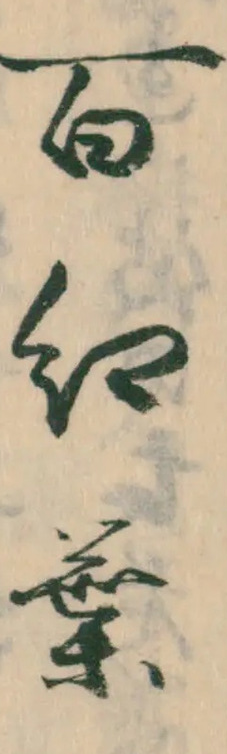百紅葉
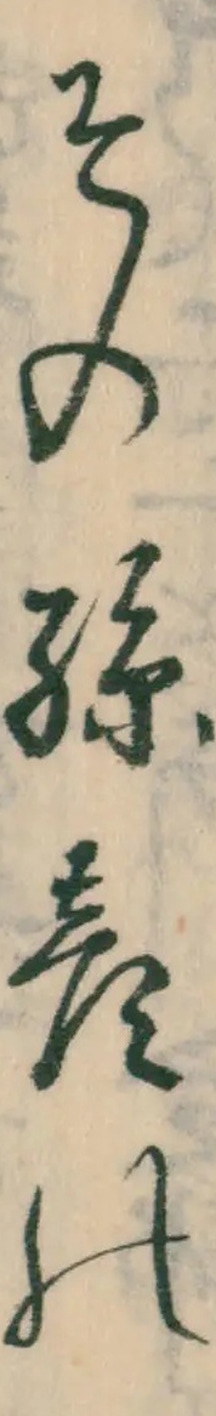その孫彦の
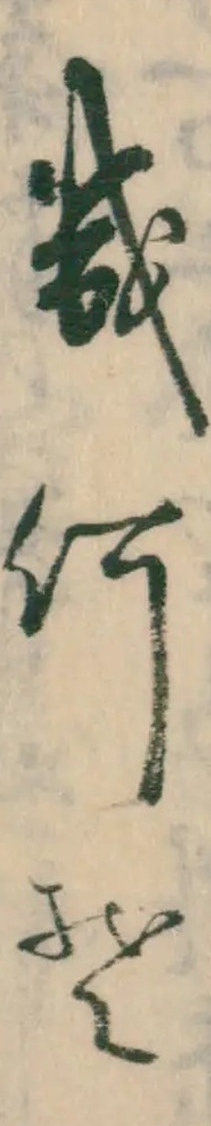幾片そ
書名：紅葉集
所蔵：国立国会図書館 National Diet Library, JAPAN
